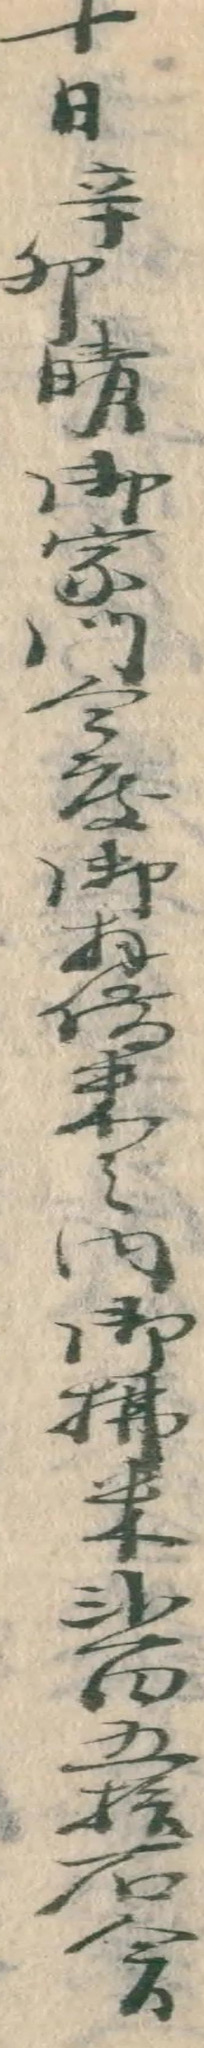十日辛卯晴御家門今度御拝借米之内御払米弐百五拾石今日
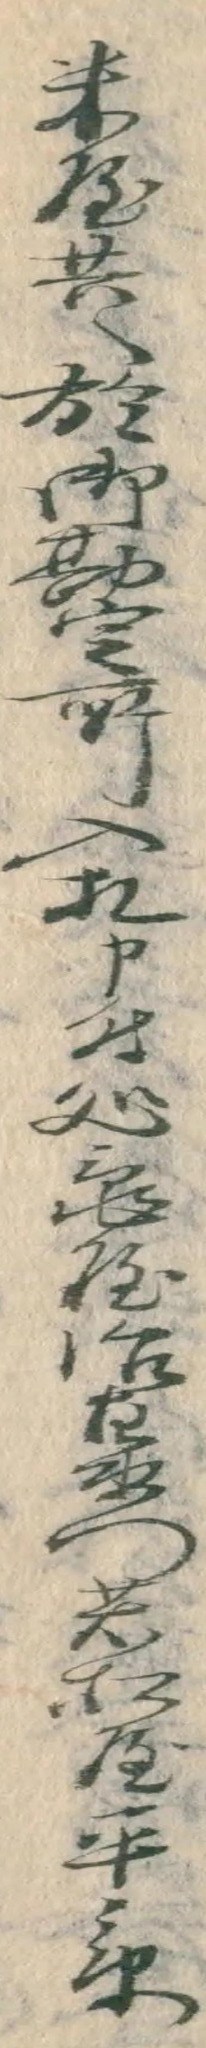米屋共へ於御勘定所入札申付処亀屋治左衛門若松屋平兵衛
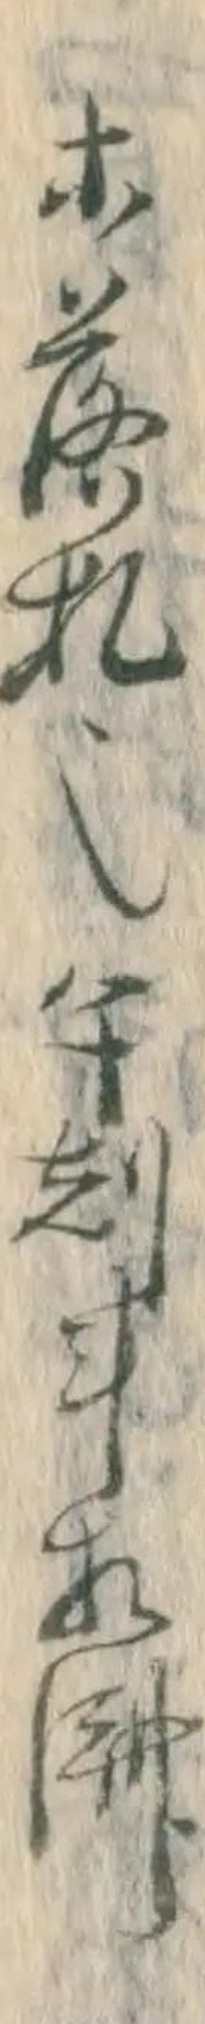等落札也午刻斗相済
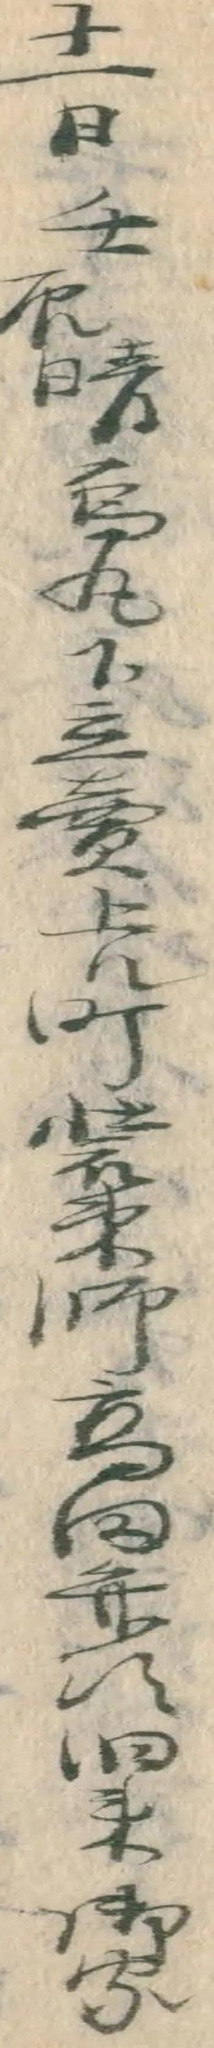十一日壬辰晴烏丸下立賣上ル町装束師高田弁頭旧来御家
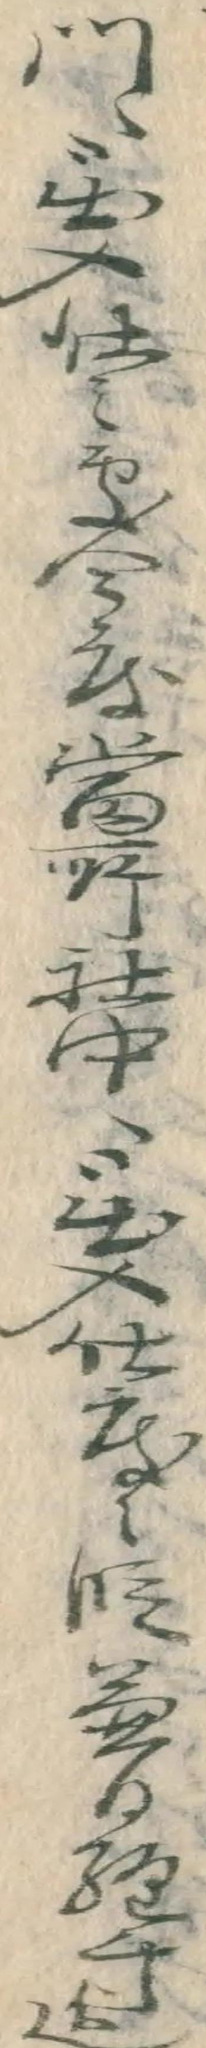門へ出入仕之處今度當所社中へ御出入仕度之段兼日経千迄

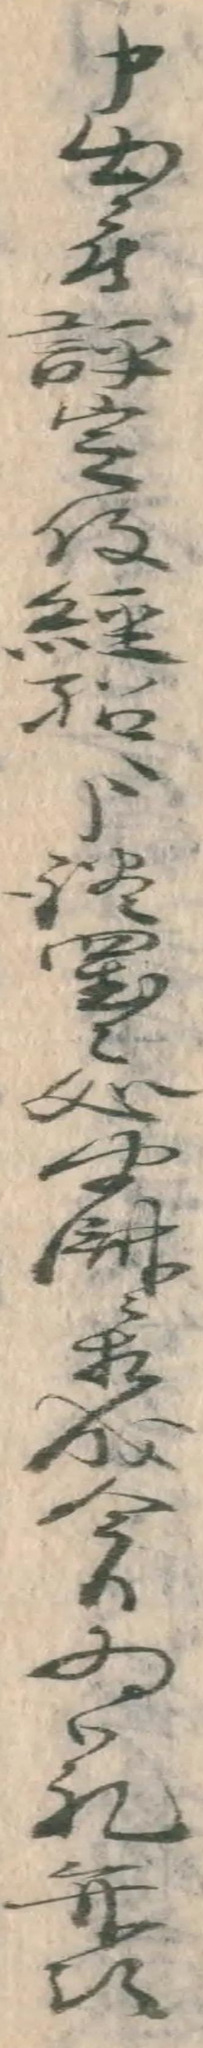申出ニ付評定役経招へ申談置候処聞済ニ相成今日為御礼弁断
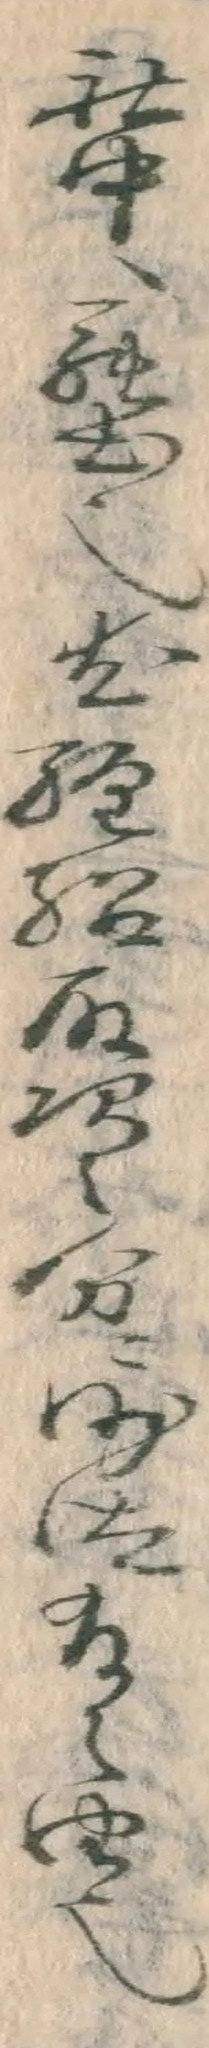社中へ罷出也尤経招殿次之分ニ沙汰有之由也
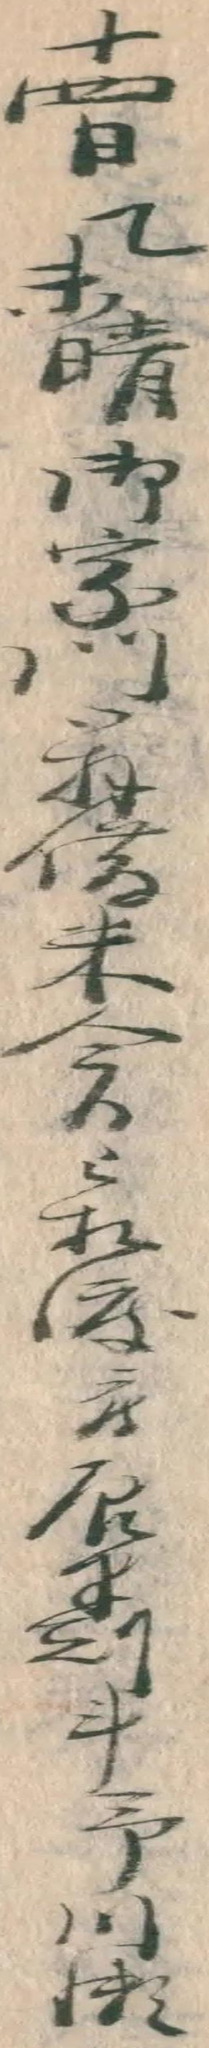十四日乙未晴御家門御拝借米今日被相渡ニ付辰半刻斗予川瀬
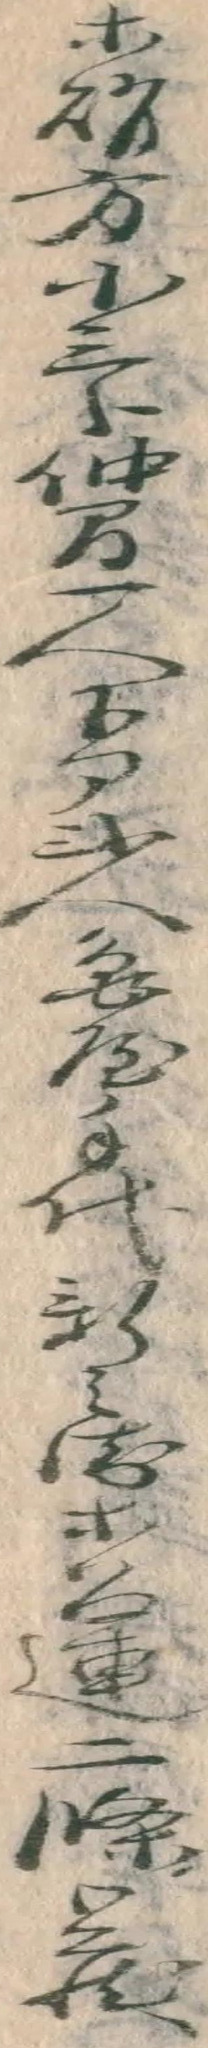等賄方小三郎仲間一人下部弐人亀屋手代新兵衛等召連二條御蔵ヘ
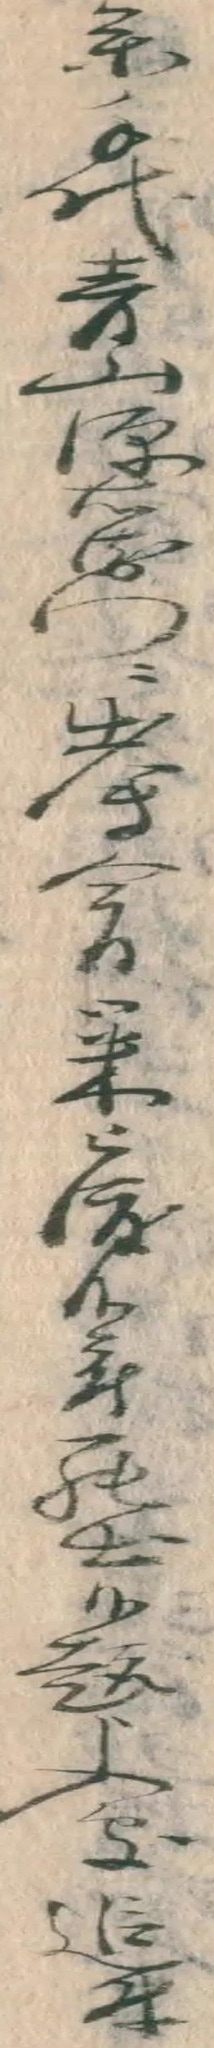参手代青山源右衛門ニ出會今日御米被渡候ニ付罷出候趣申入處追付
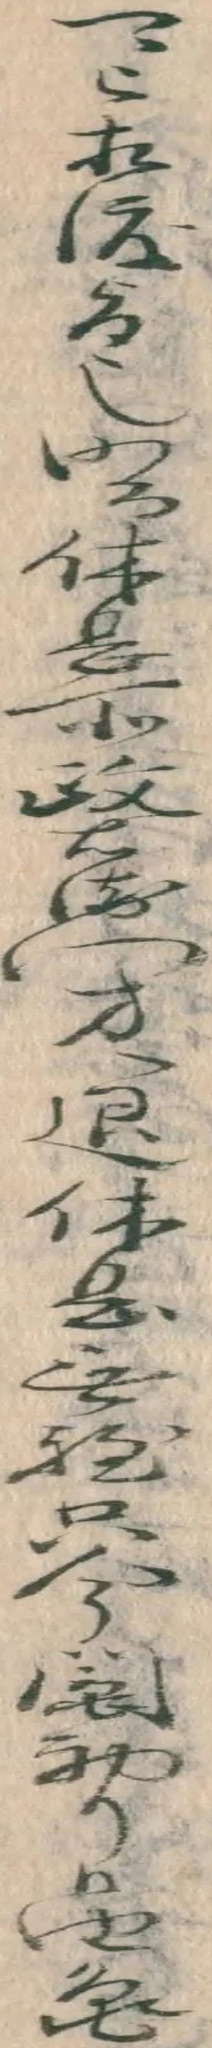可被相渡旨也仍而休息所政右衛門方へ退休息無程只今鬮勤リ候由亀
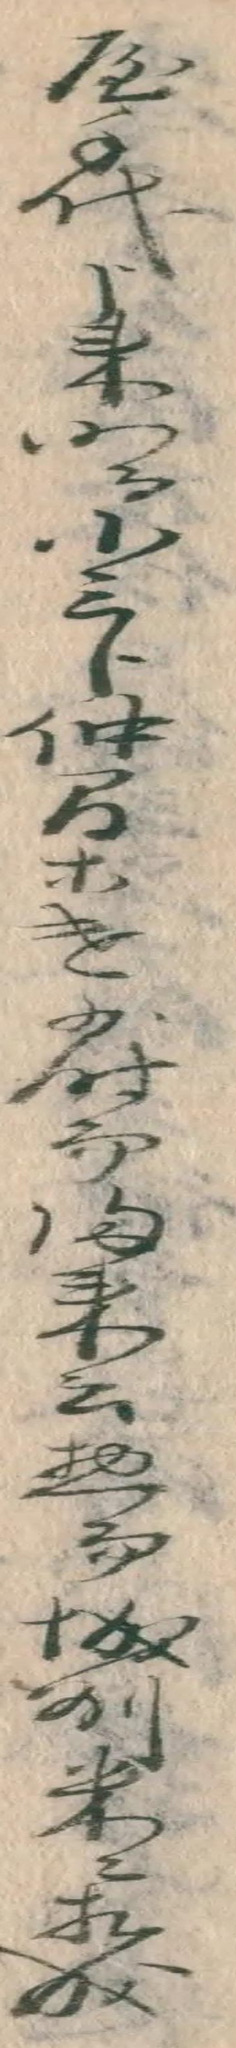屋手代申来仍而小三分仲間等遣少時而帰来云惣而城州米二相成
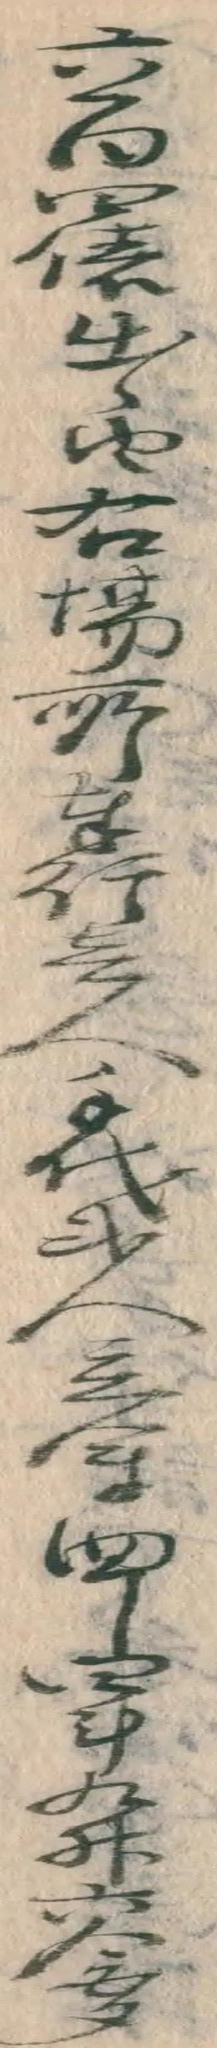六百四俵出候由右場所奉行壱人手代弐人立会四ー四斗九升六合五夕
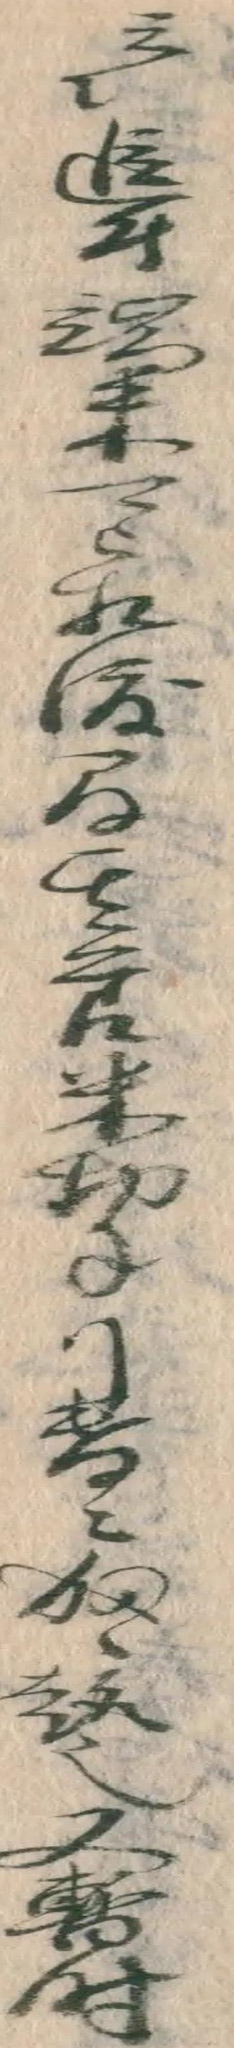云々追付調米可被相渡間其節米切手引替ニ成候趣也又暫時
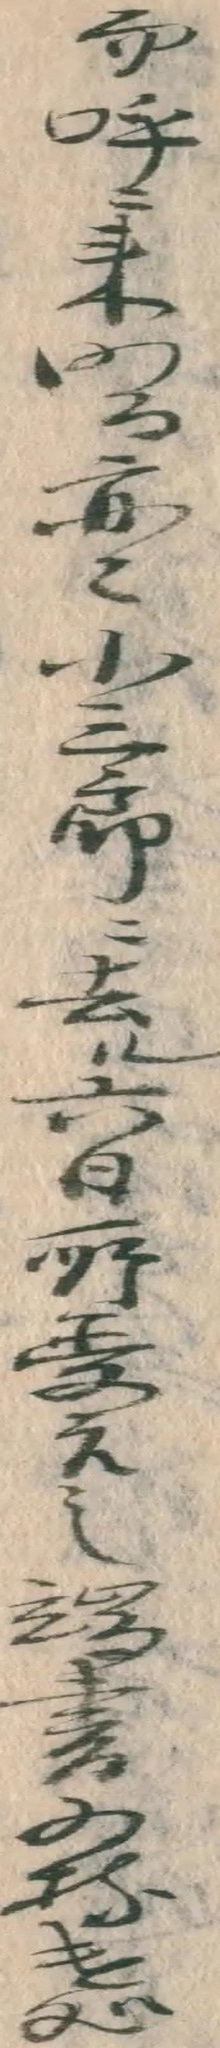而呼ニ来仍而亦々小三郎に去ル六日所受取候之端書為持遣処
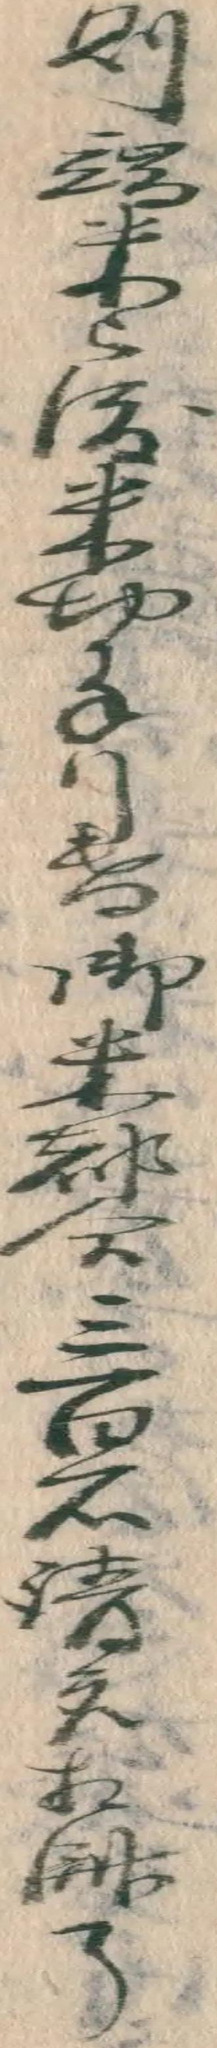則端来被渡米切手引替御米都合三百石請取相済了
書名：賀茂社記録. 第65冊
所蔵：国立国会図書館 National Diet Library, JAPAN
